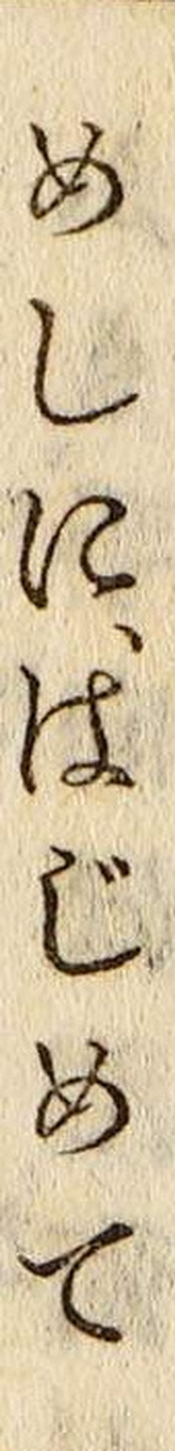めしに、はじめて
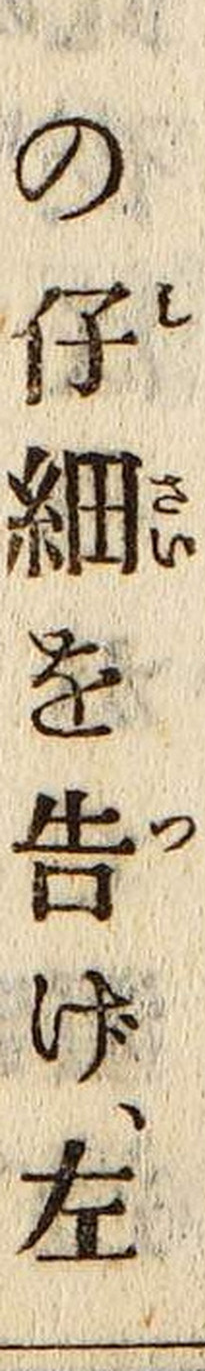の仔細を告げ、左
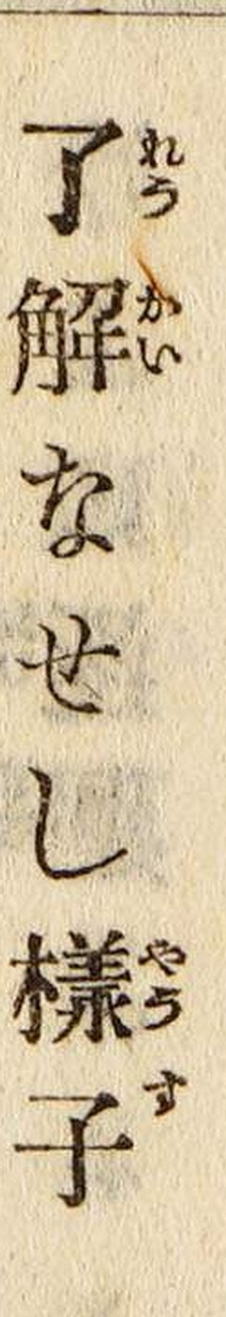了解なせし様子
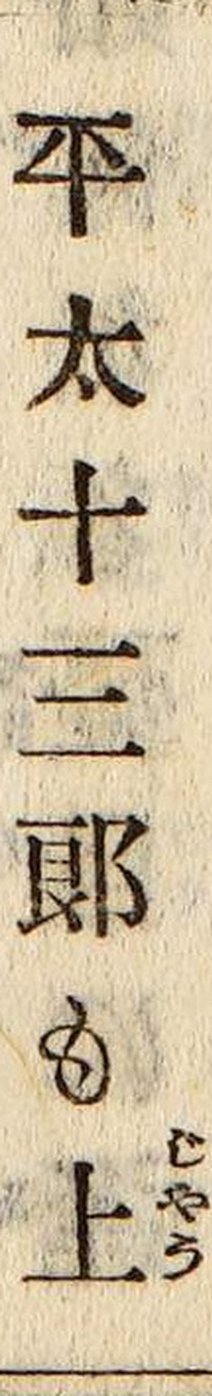平太十三郎も上
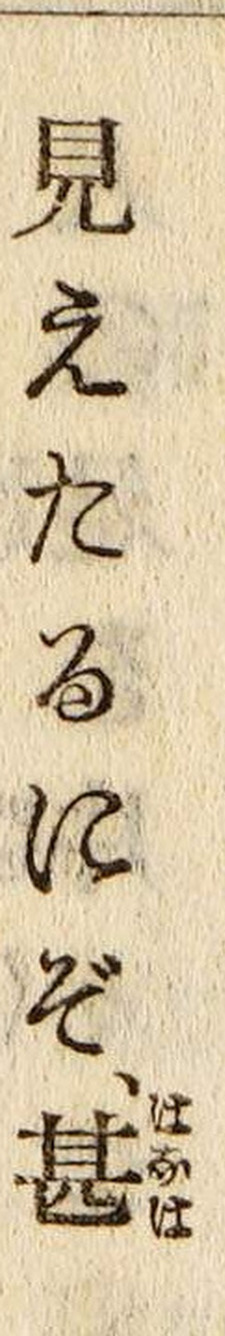見えたるにぞ、甚
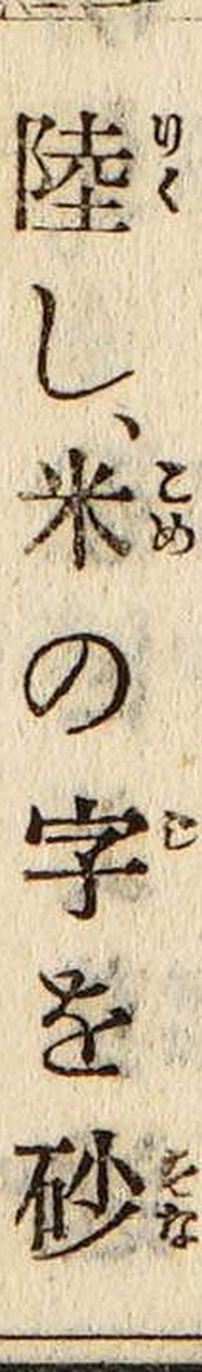陸し、米の字を砂
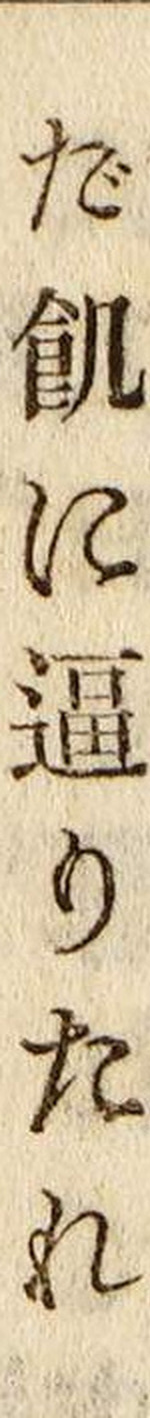だ飢に逼りたれ
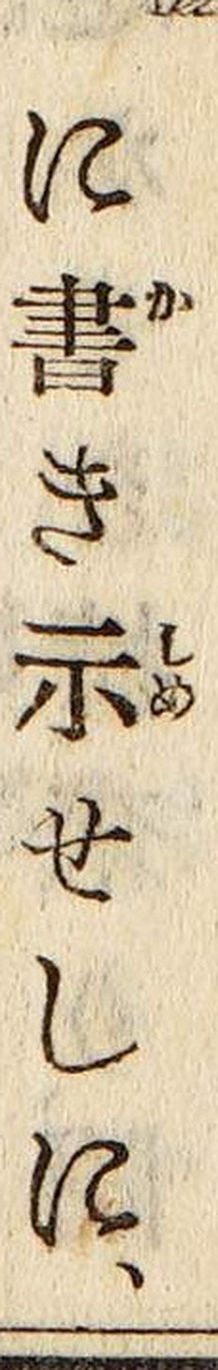に書き示せしに、
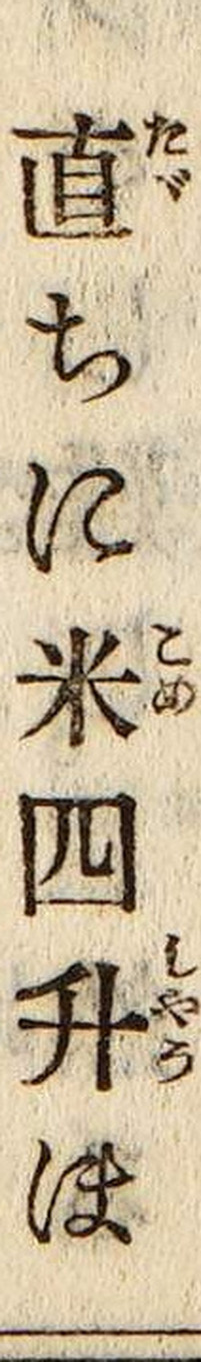直ちに米四升ほ
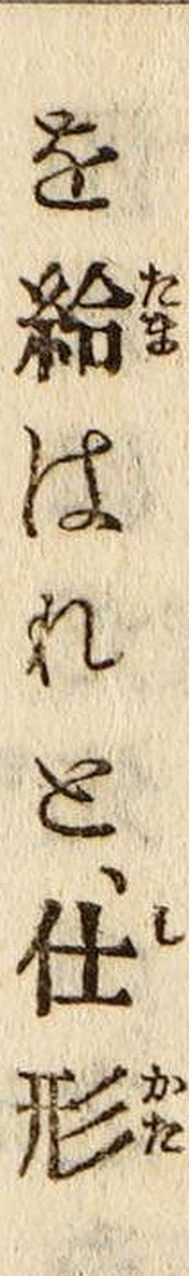を給はれと、仕形
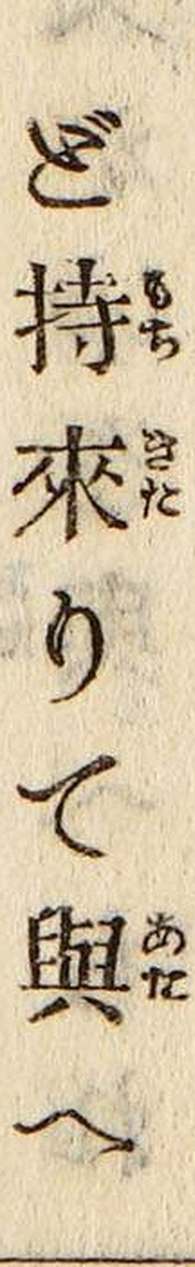ど持来りて与へ
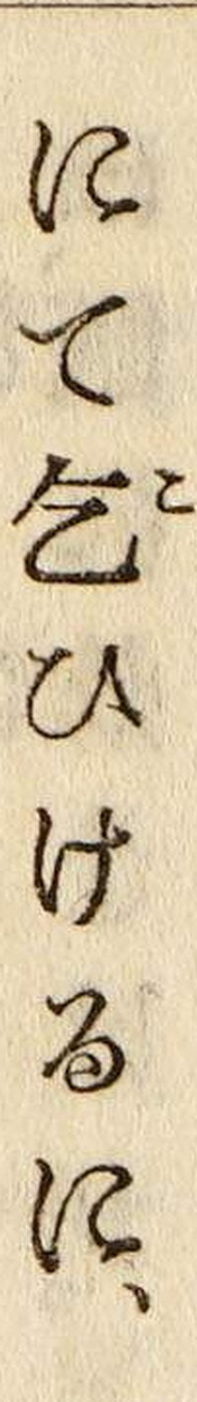にて乞ひけるに、
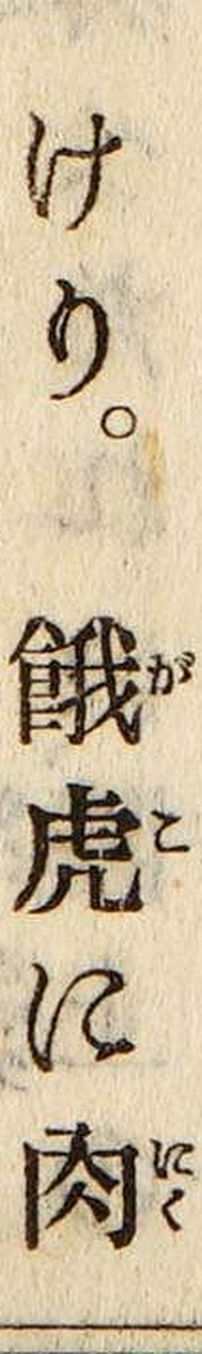けり。餓虎に肉
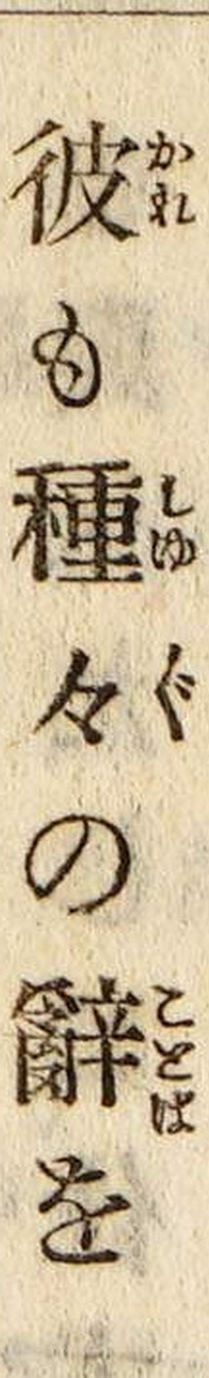彼も種々の辞を
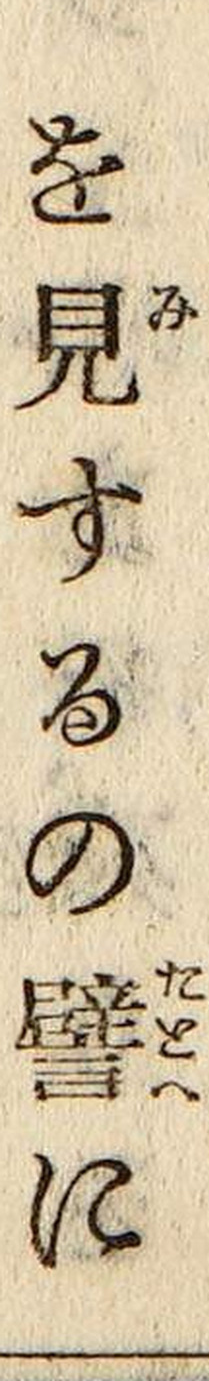を見するの譬に
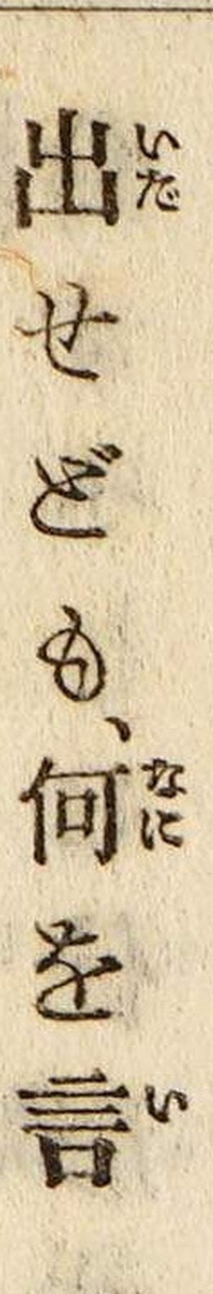出せども、何を言
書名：日本漂流譚
